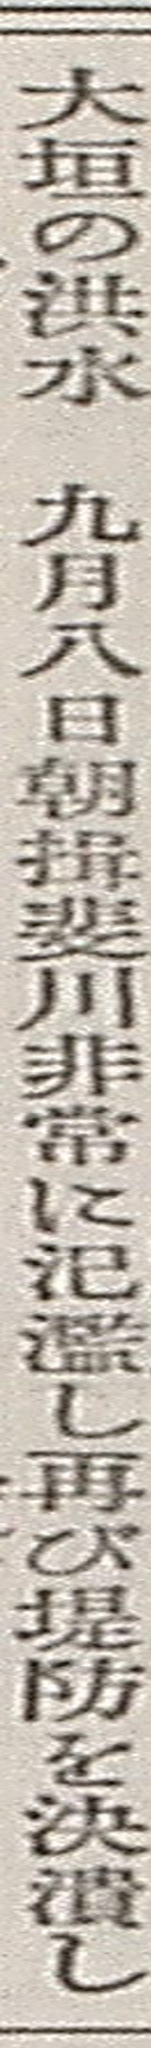大垣の洪水九月八日朝揖斐川非常に氾濫し再び堤防を决潰し
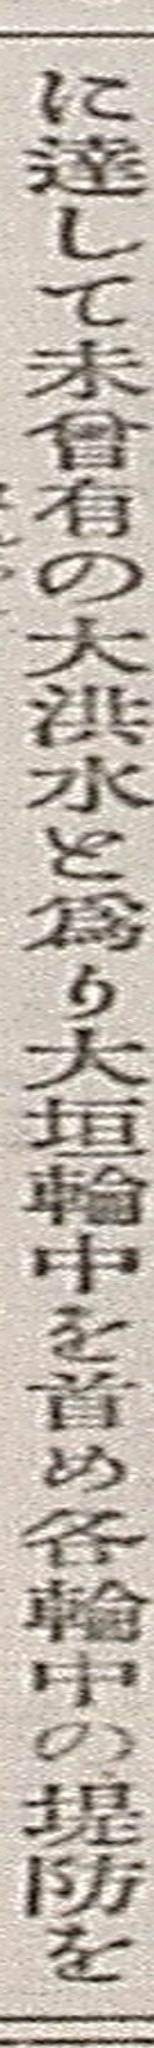に達して未曾有の大洪水と為り大垣輪中を首め各輪中の堤防を
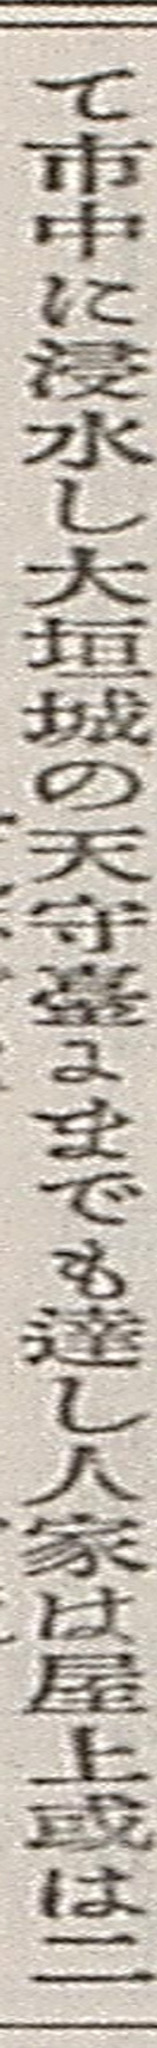て市中に浸水し大垣城の天守台にまでも達し人家は屋上或は二
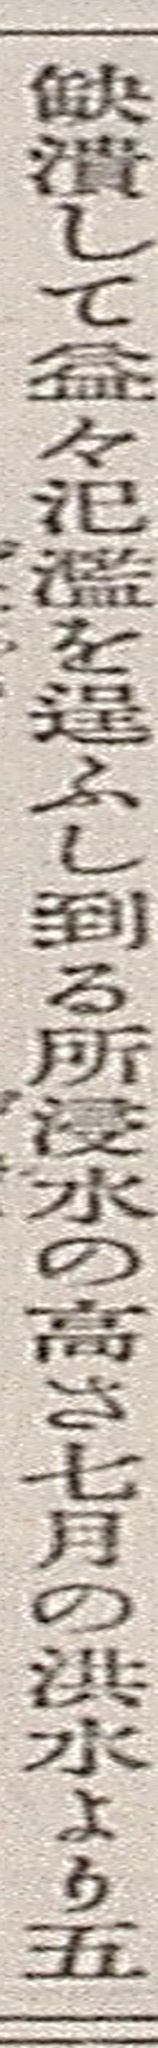歇潰して益々氾濫を逞ふし到る所浸水の高さ七月の洪水より五
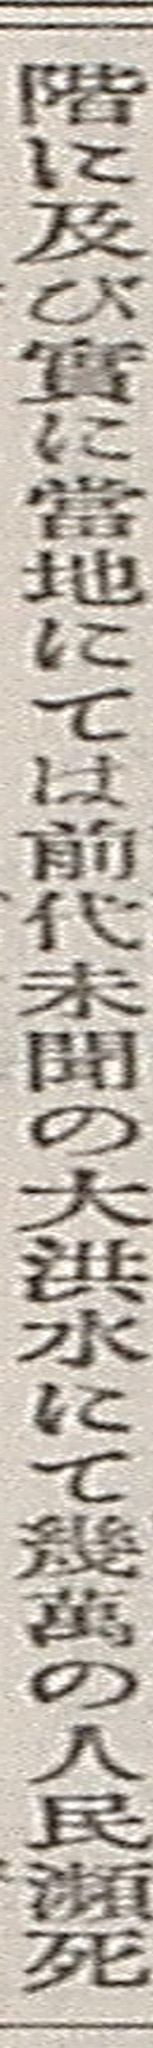階に及び実に当地にては前代未聞の大洪水にて幾万の人民瀕死
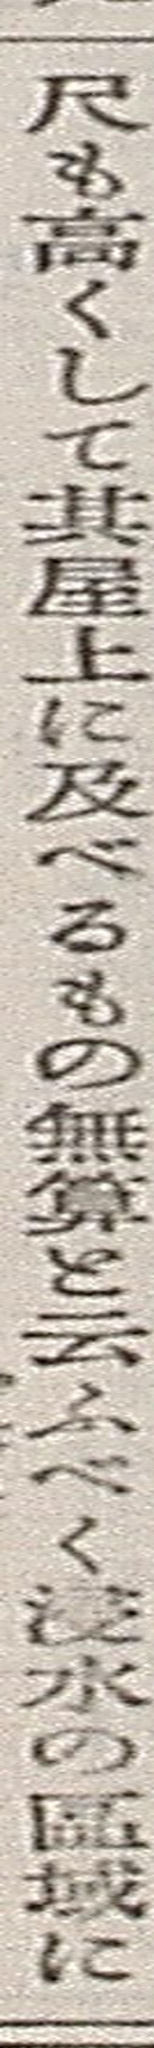尺も高くして其屋上に及べるもの無算と云ふべく浸の區域に
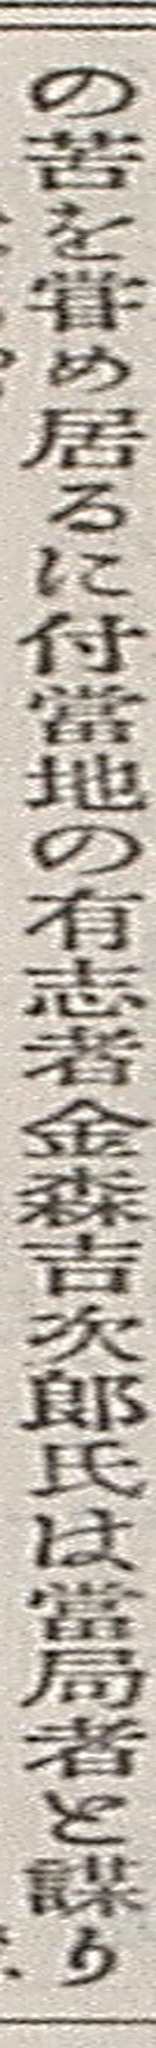の苦を嘗め居るに付当地の有志者金森吉次郎氏は当局者と謀り
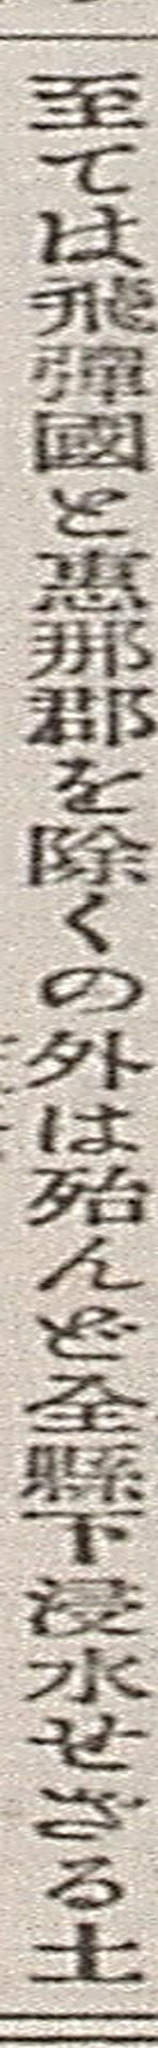至ては飛騨国と恵那郡を除くの外は殆んど全縣下浸水せざる土
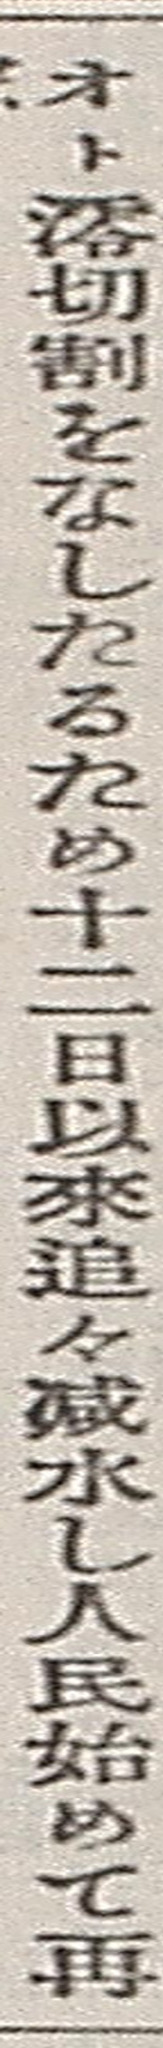オト澪切割をなしたるため十二日以来追々減水し人民始めて再
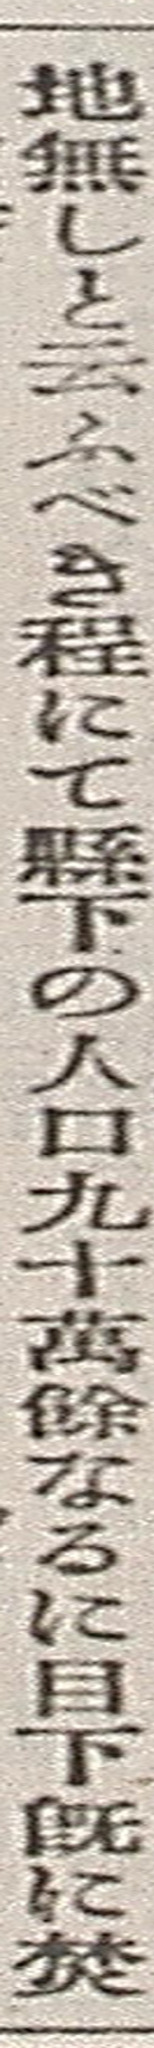地無しと言ふべき程にて縣下の人口九十万餘なるに目下既に焚
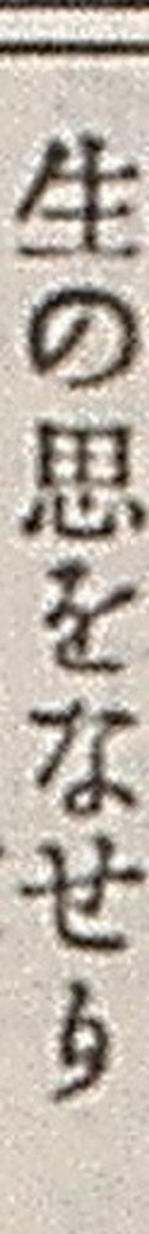生の思をなせり
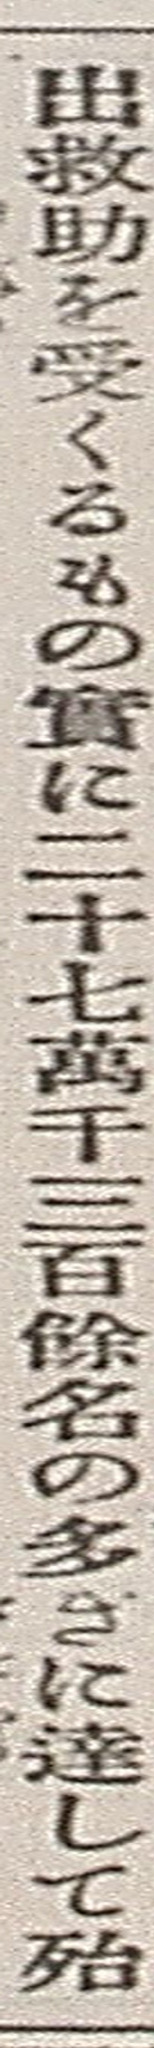出救助を受くるもの実に二十七万千三百餘名の多きに達して殆
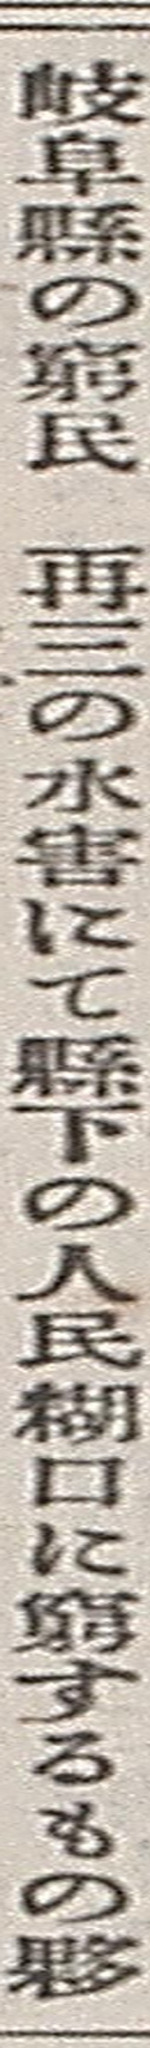岐阜県の窮民再三の水害にて県下の人民糊口に窮するもの夥
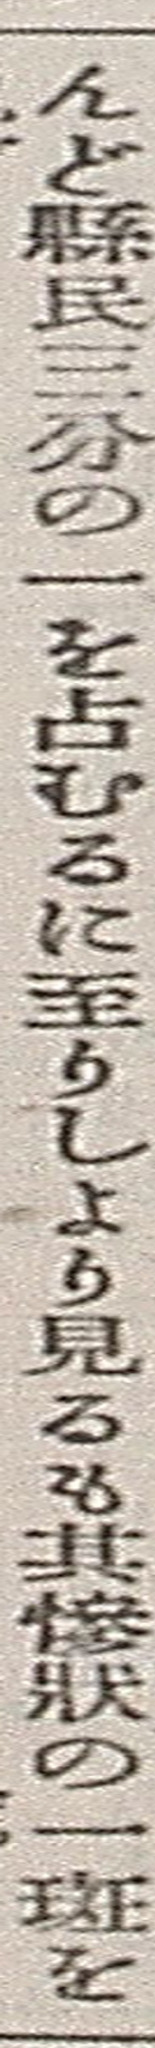んど縣民三分の一を占むるに至りしより見るも其惨状の一班を
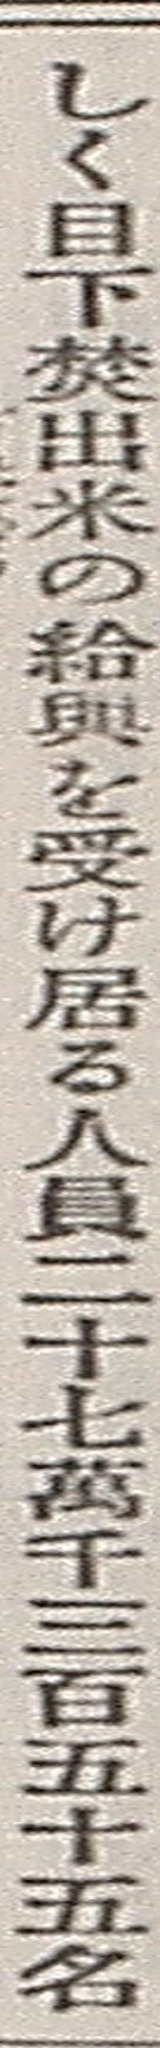しく目下焚出米の給与を受け居る人員二十七万千三百五十五名
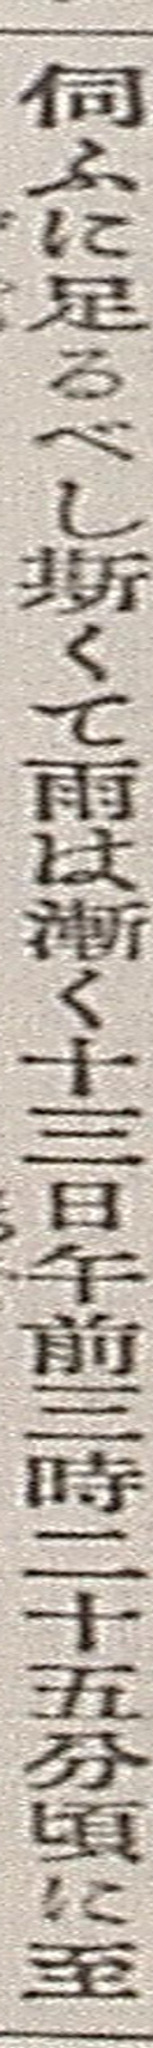伺ふに足るべし斯くて雨は漸く十三日午前三時二十五分頃に至
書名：風俗畫報臨時増刊第百二十六號　洪水被害録（中）
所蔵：東京大学地震研究所図書室 Earthquake Research Institute Library, The University of Tokyo, JAPAN
